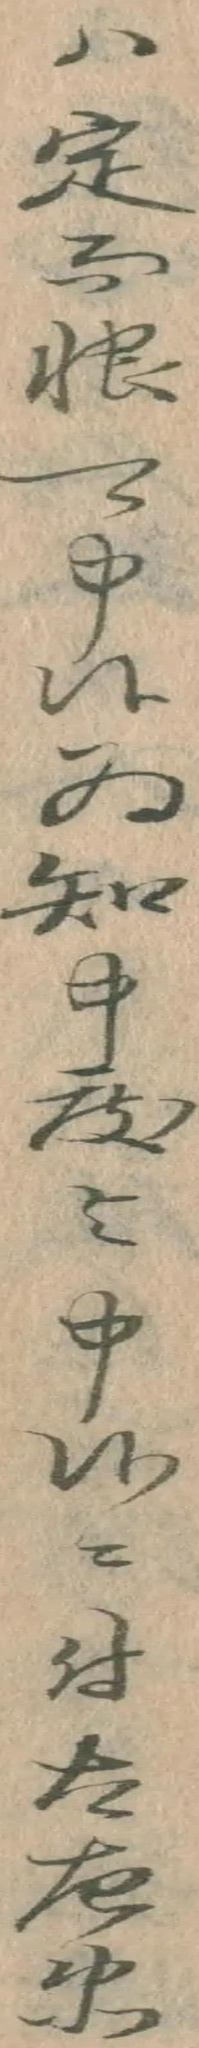は定而恨て申候ゐ知申度与申候に付太左衛
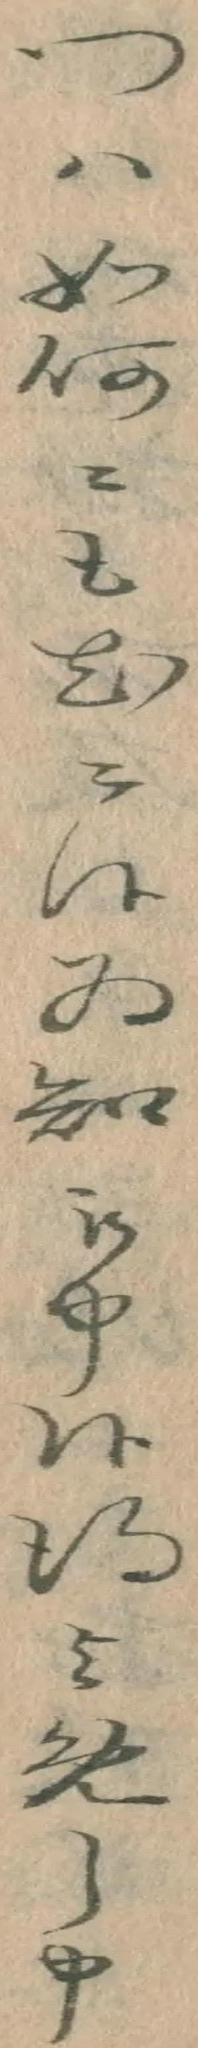門は如何にも尤に候ゐ知被申候得与免し申
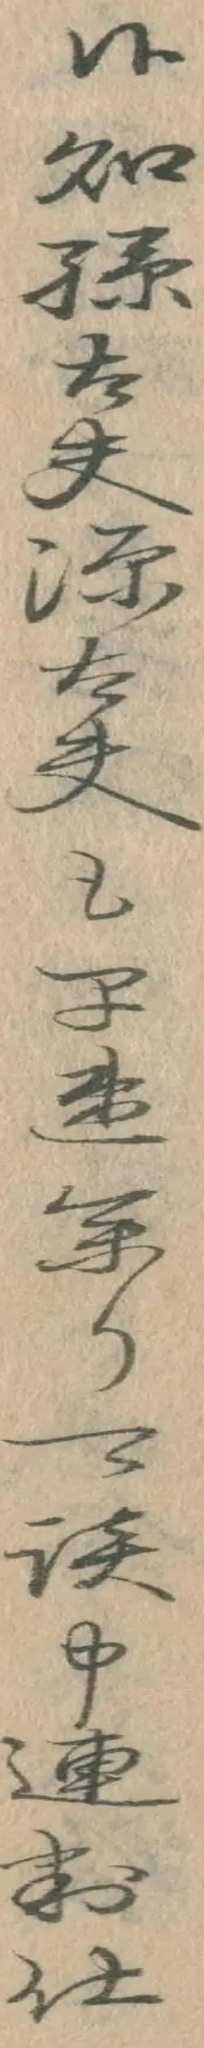候処孫太夫源太夫も早速参り可談申連判仕
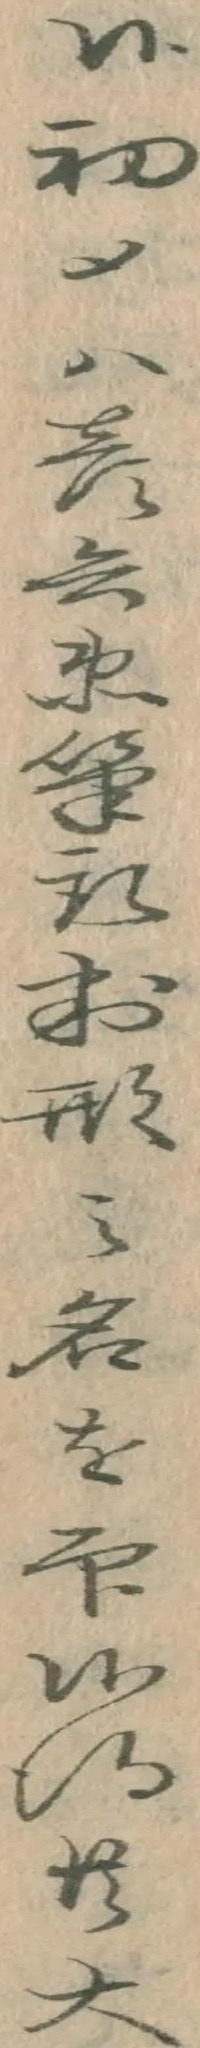候初めは彦兵衛筆取判形之名を印候得共大
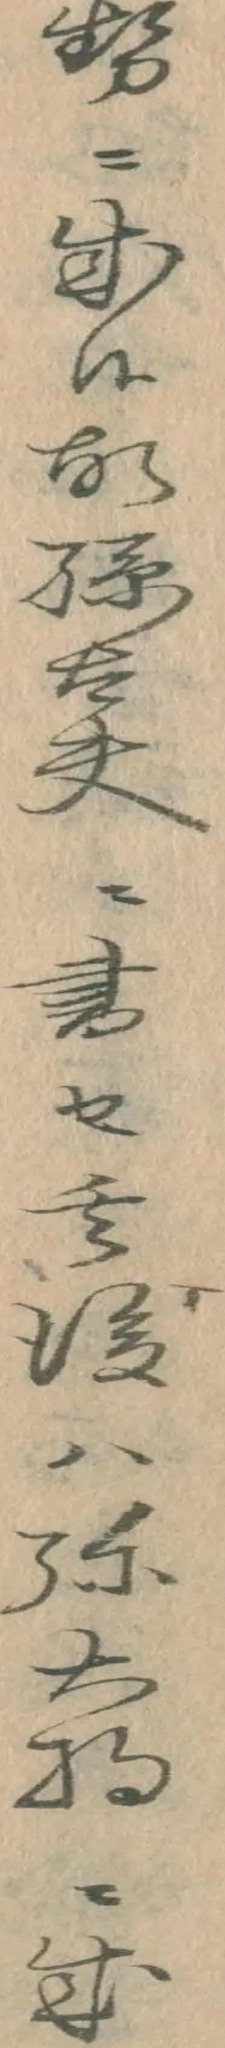勢に成候故孫太夫に書せ其後は弥大将に成

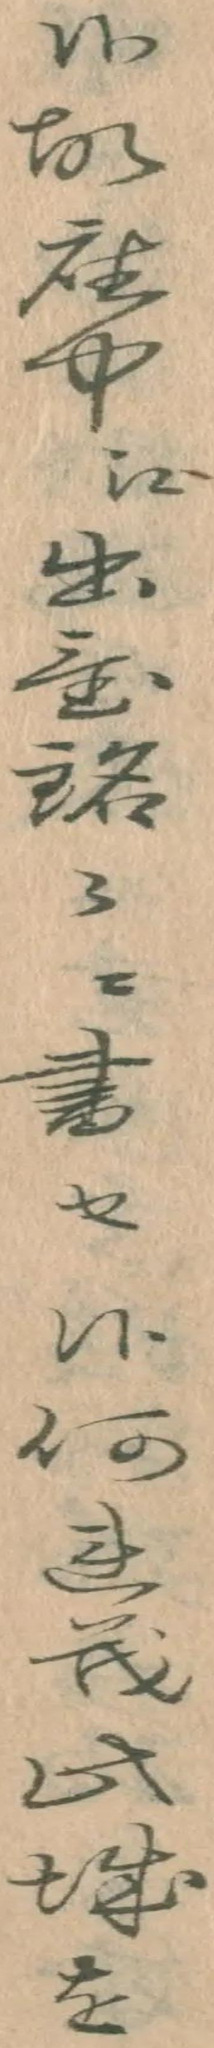候故座中江出置銘々に書せ候何連茂此城を
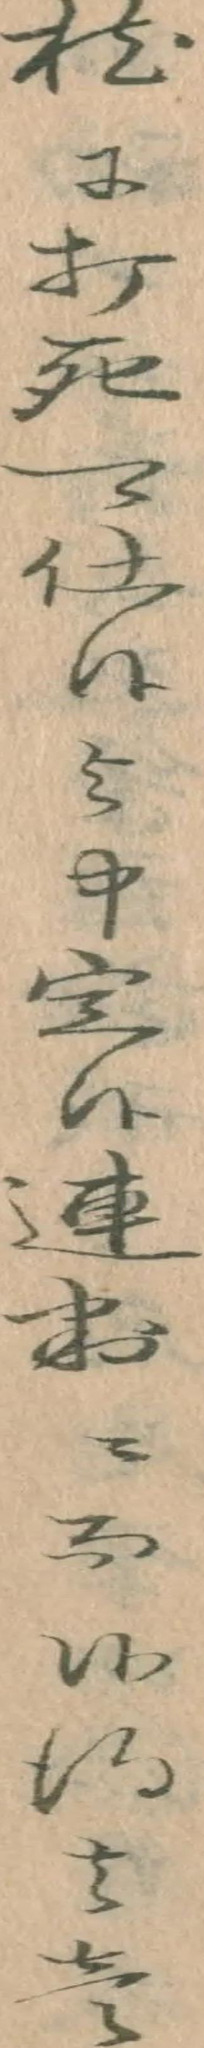枕尓打死可仕候与申定候連判に而候得者壱
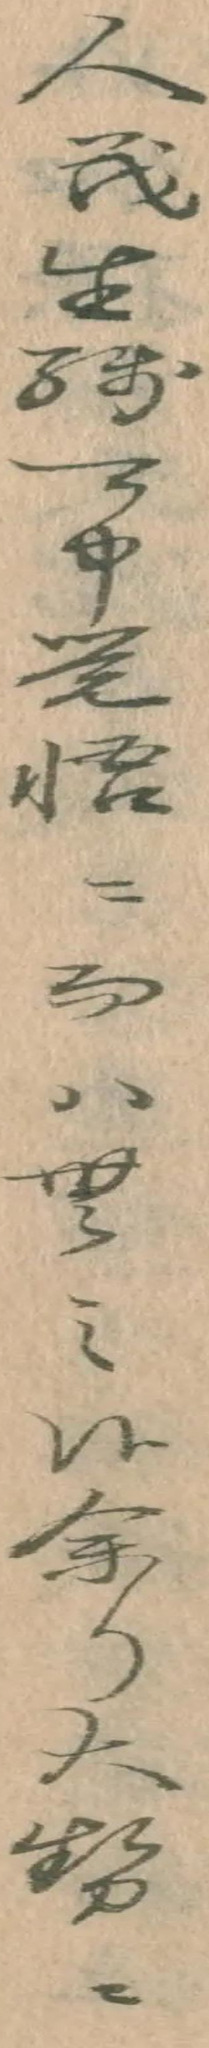人茂生残可申覚悟に而は無之候余り大勢に
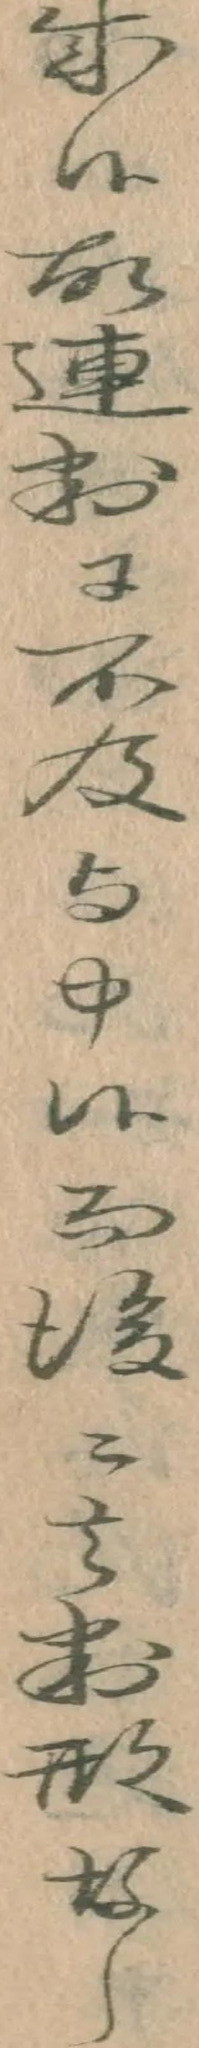成候故連判尓不及与申候而後に者判形なし
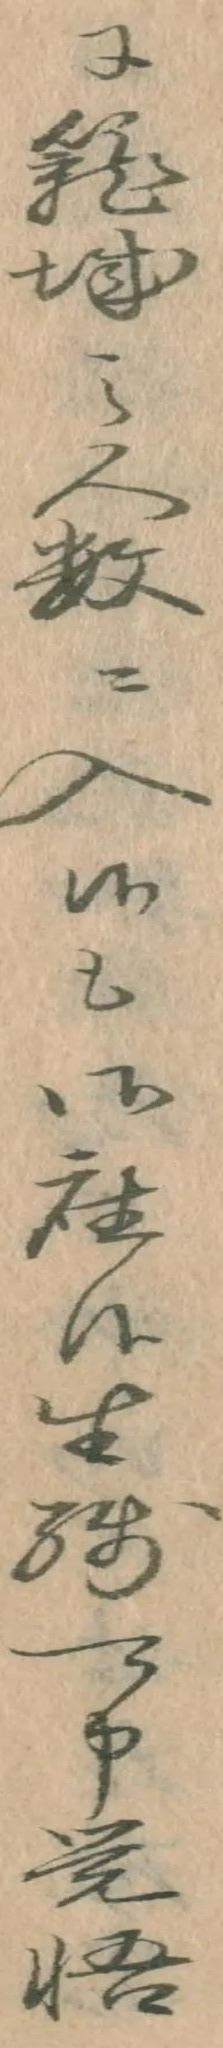尓籠城之人数に入候も御座候生残可申覚悟
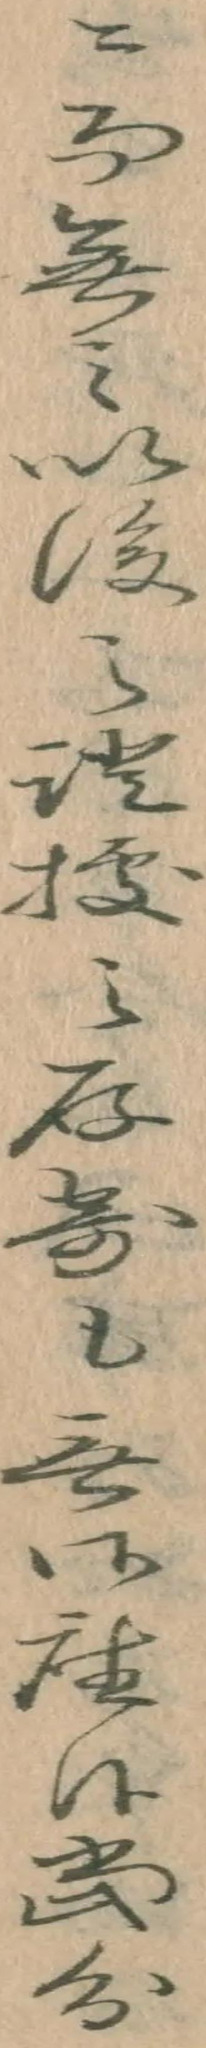に而無之以後之證拠之存寄も無御座候当分
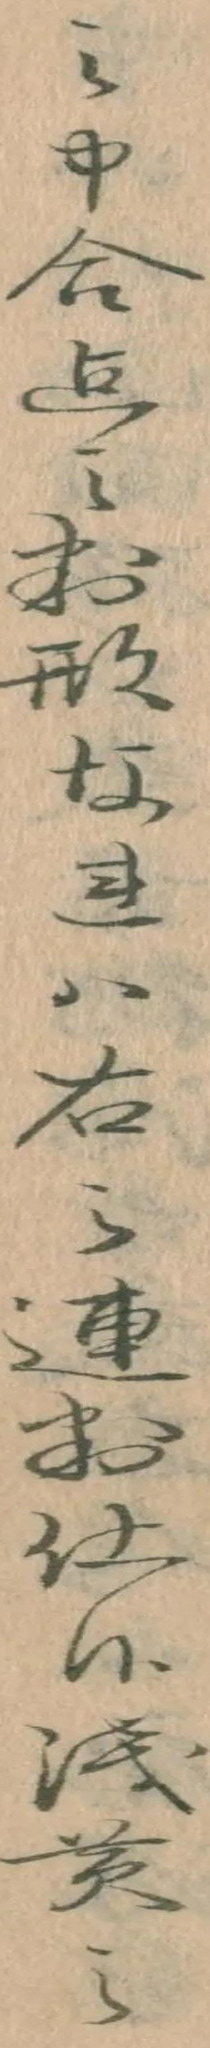之申合迄之判形な連は右之連判仕候浅黄之
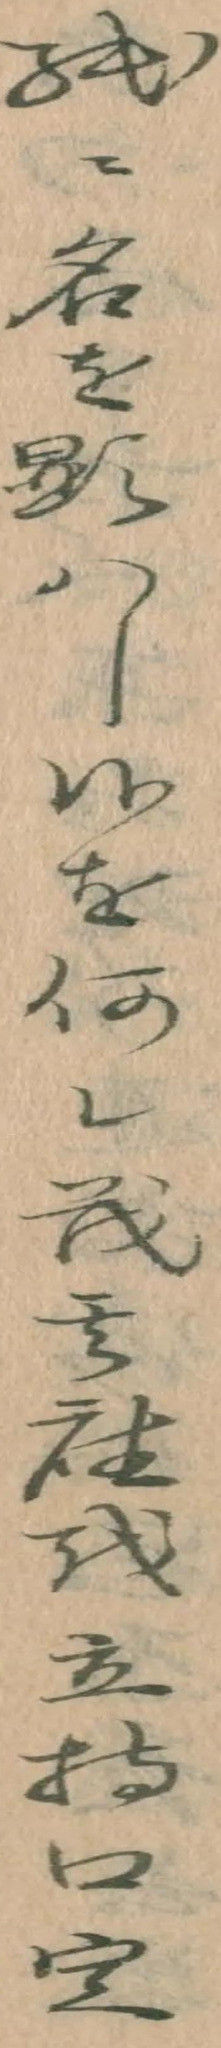紙に名を顕はし候を何れ茂其座越立持口定
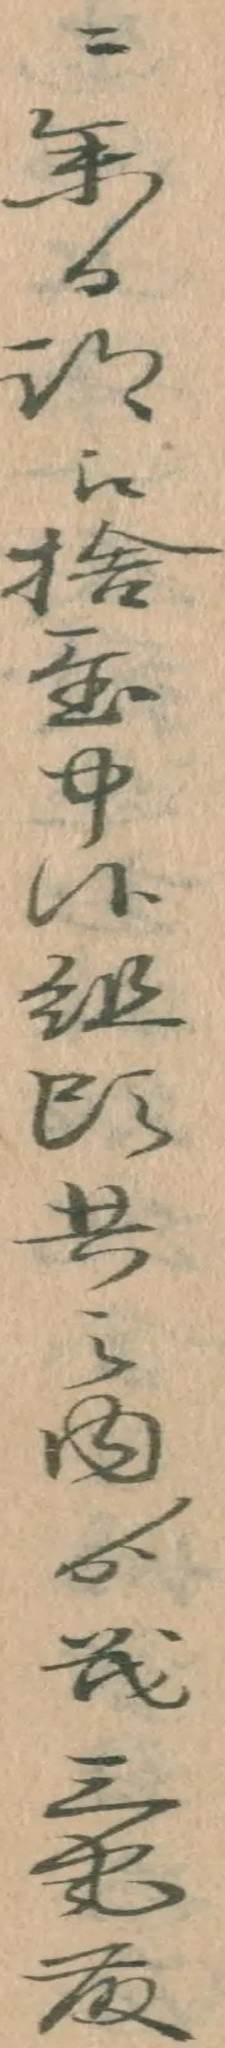に参る跡江捨置申候組頭共之内ゟ茂三宅藤
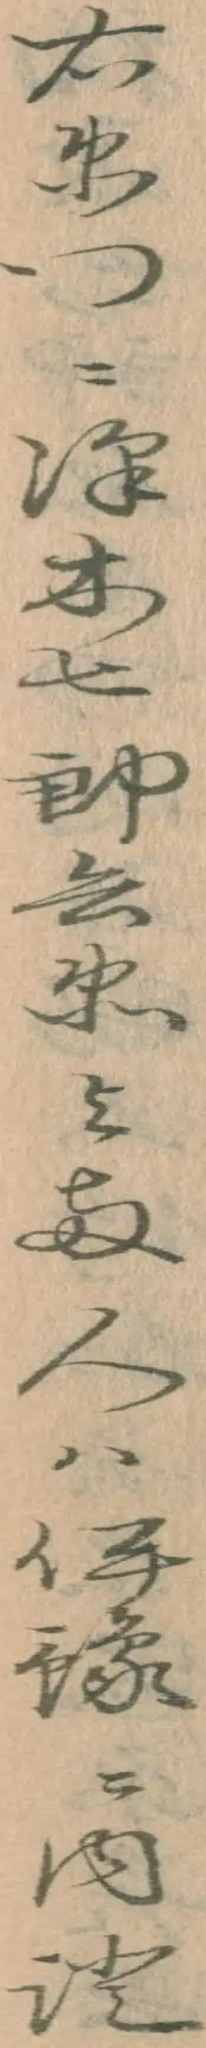右衛門に沢木七郎兵衛与両人は伊予に内證
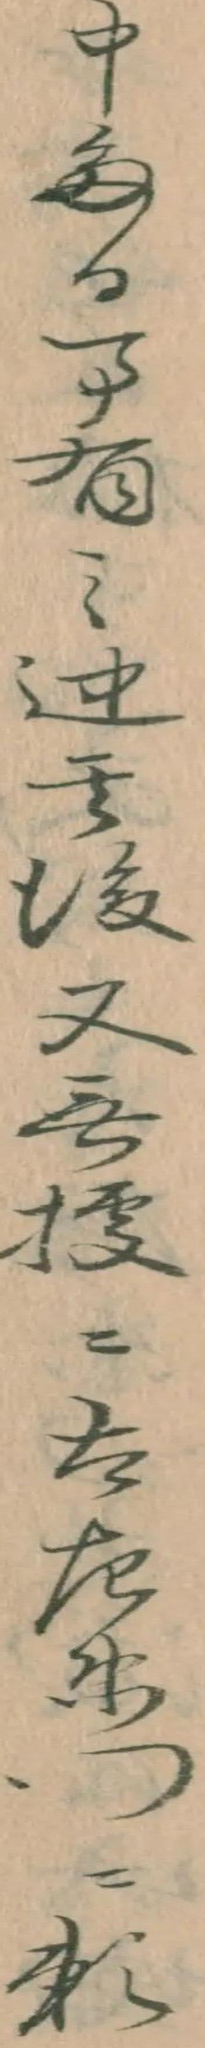申多る事有之迚其後又無拠に太左衛門に頼
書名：切支丹御退治記 49巻. [2]
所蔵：国立国会図書館 National Diet Library, JAPAN
